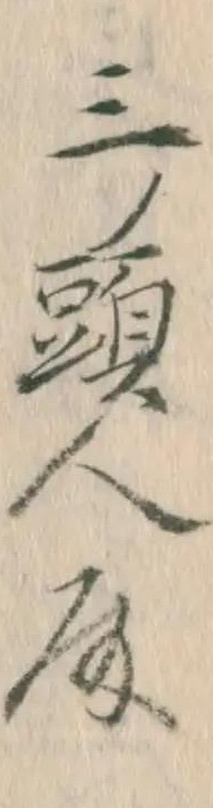三ノ頭人殿
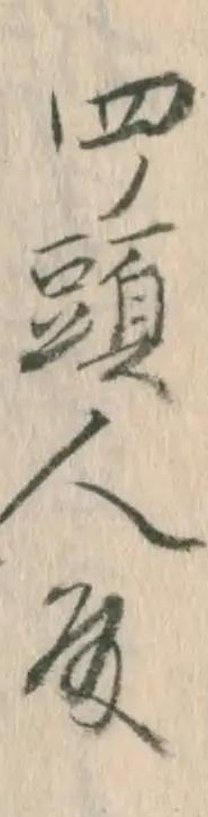四ノ頭人殿
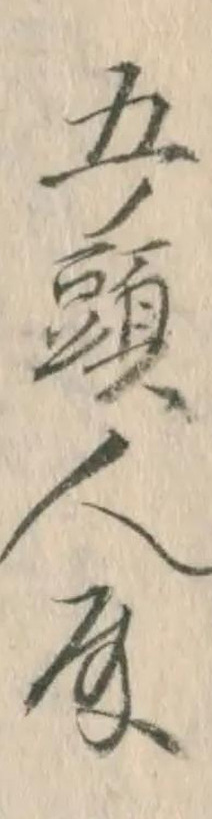五ノ頭人殿
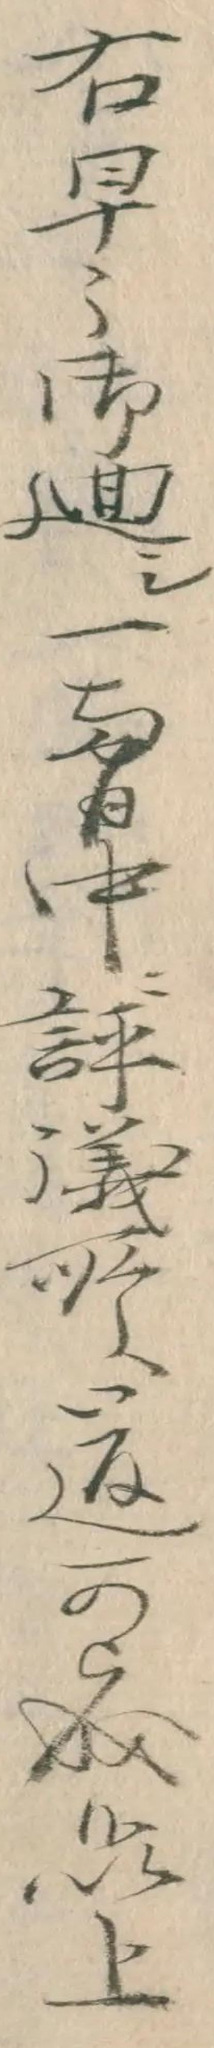右早〻御廻シ一両日中ニ評議所へ御返可被成候以上

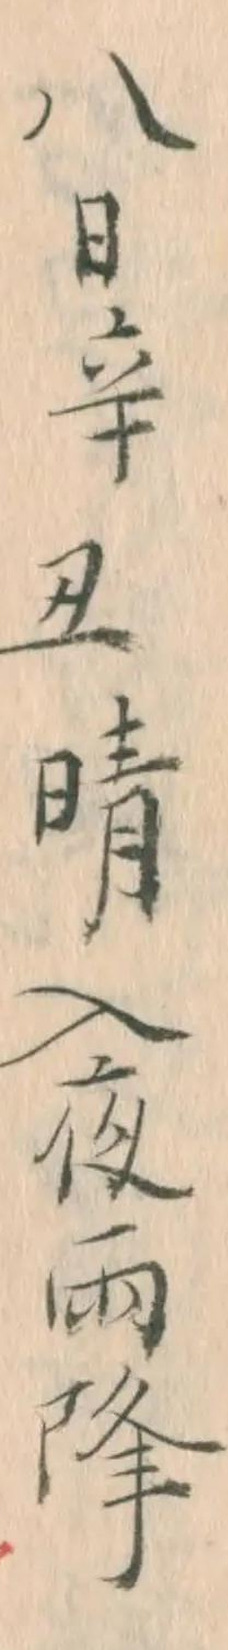八日辛丑晴入夜雨降
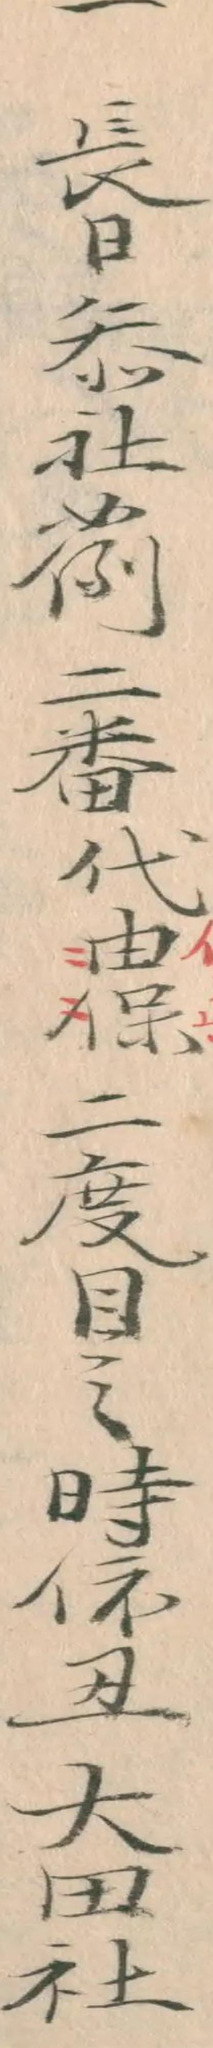一長日参社如何二番代由保二度目之時依丑大田社
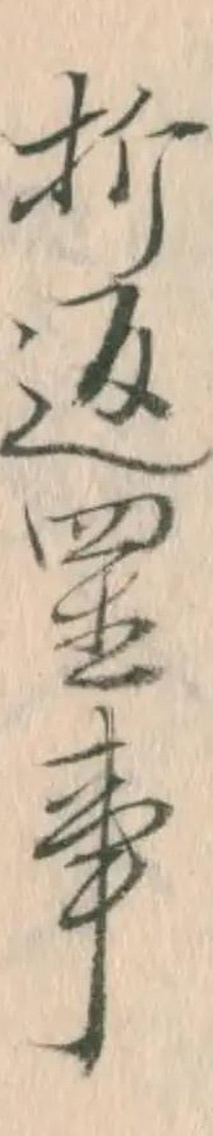折返置事
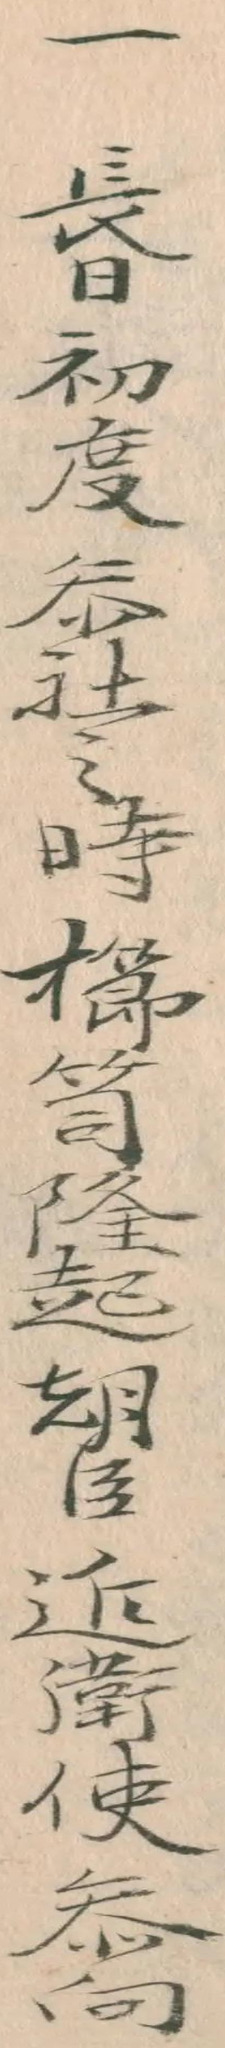一長日初度参社之時櫛笥隆起朝臣近衛使参向
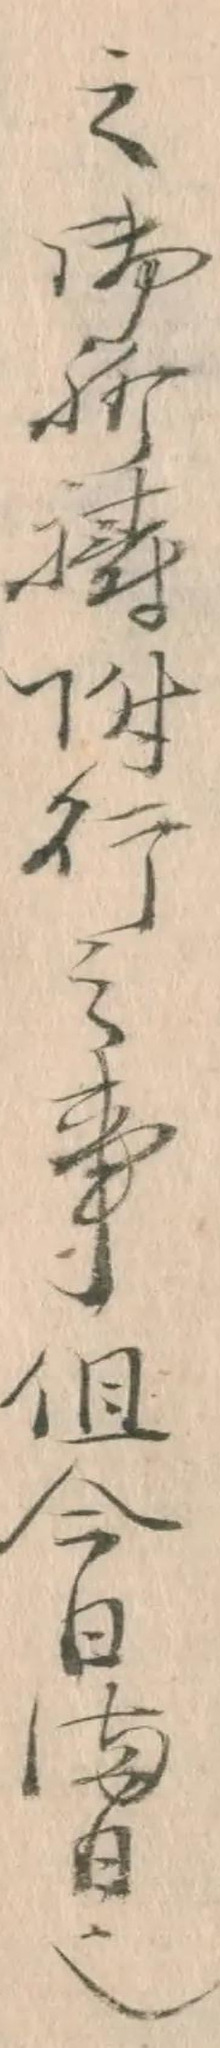之御祈祷附行之事但今日満日也
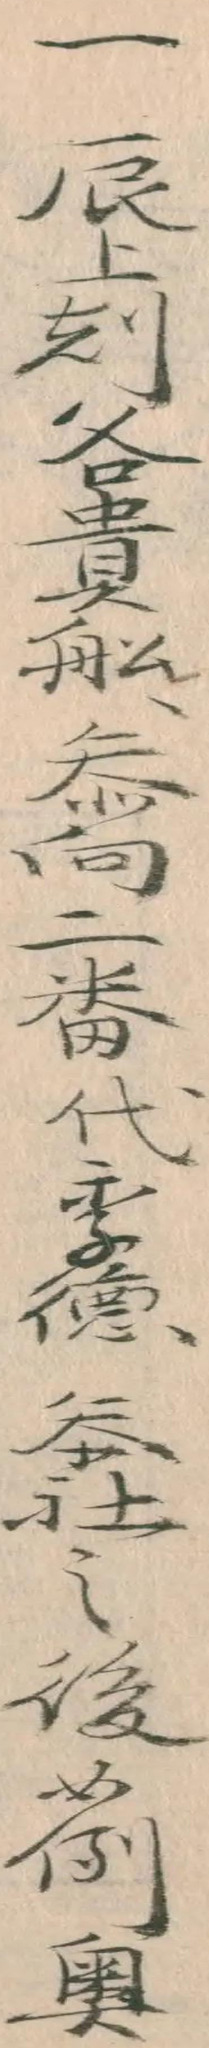一辰上刻各貴舩ヘ参向二番代季徳参社之後如例奥
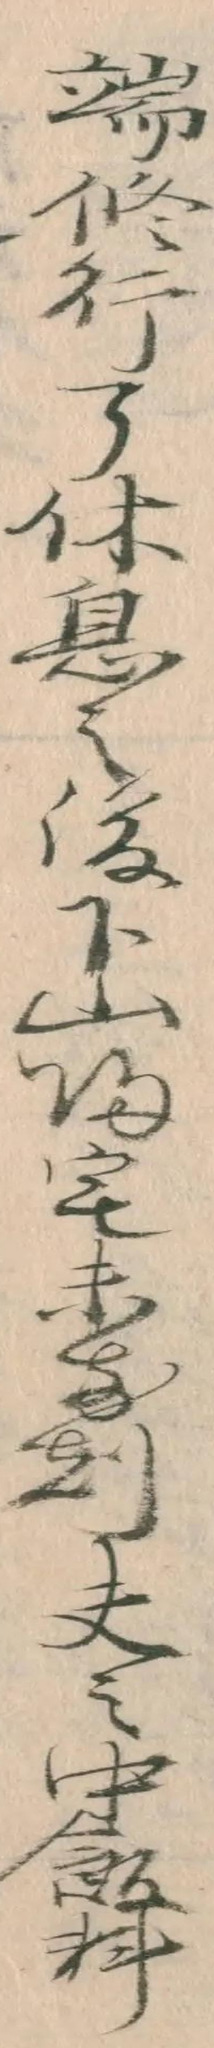端修行了休息之後下山帰宅未前刻夫之中飯料
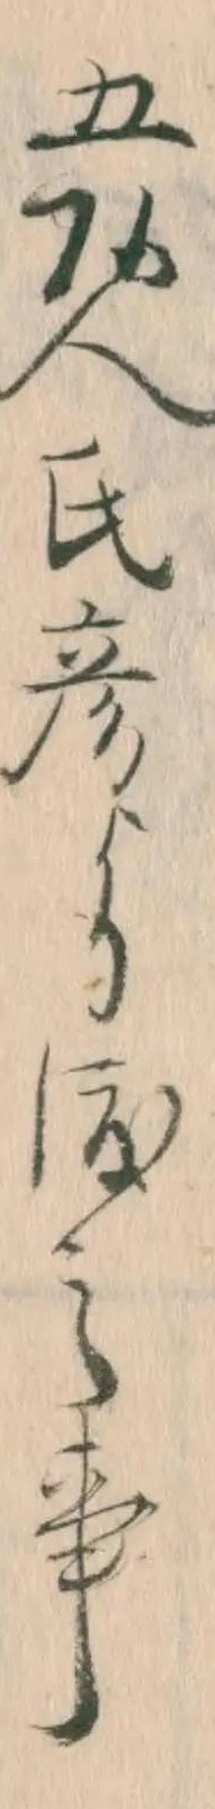五頭人氏彦より渡之事
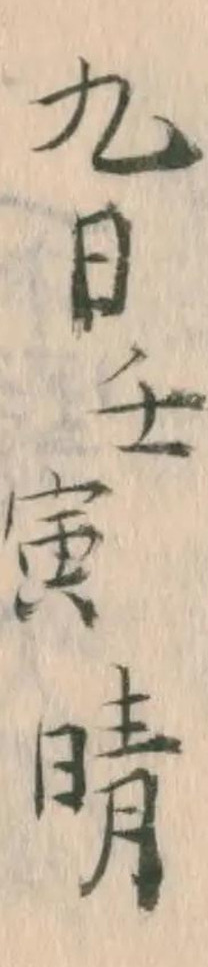九日壬寅晴
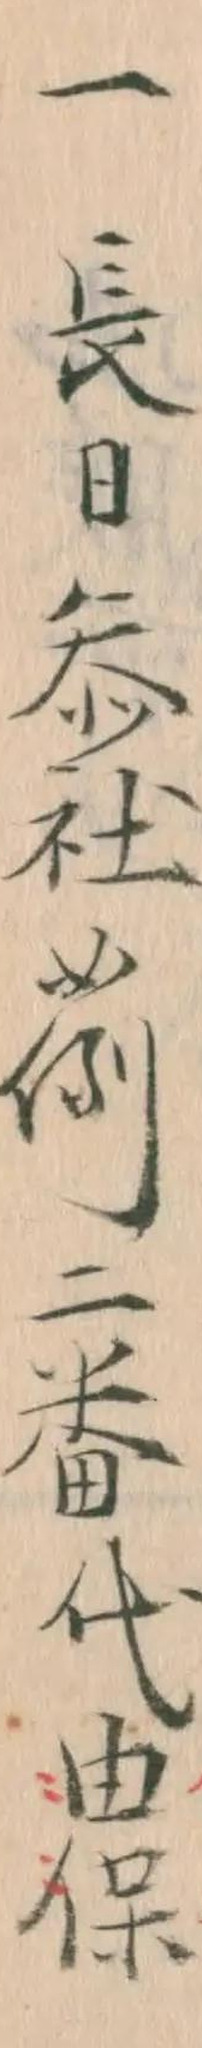一長日参社如例二番代由保
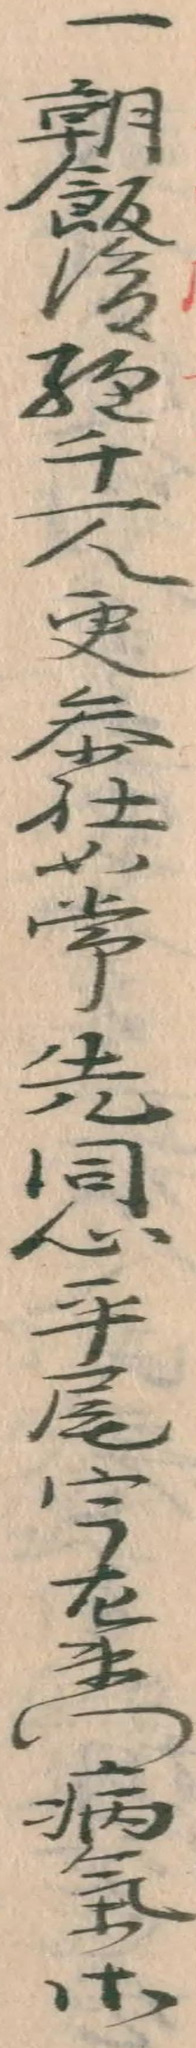一朝飯後経千一人更参社如常先同心平尾宇左衛門病氣御
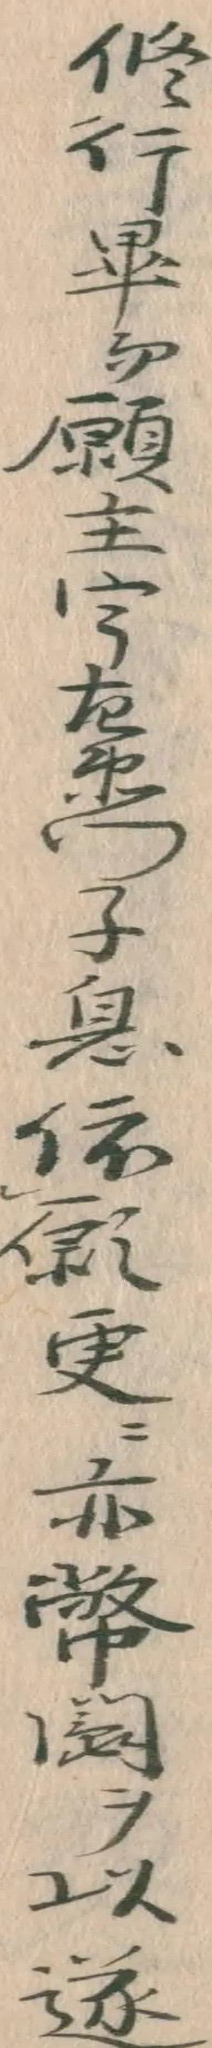修行畢而願主宇左衛門子息依願更ニ亦幣鬮ヲ以遂
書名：賀茂社記録. 第73冊
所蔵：国立国会図書館 National Diet Library, JAPAN
